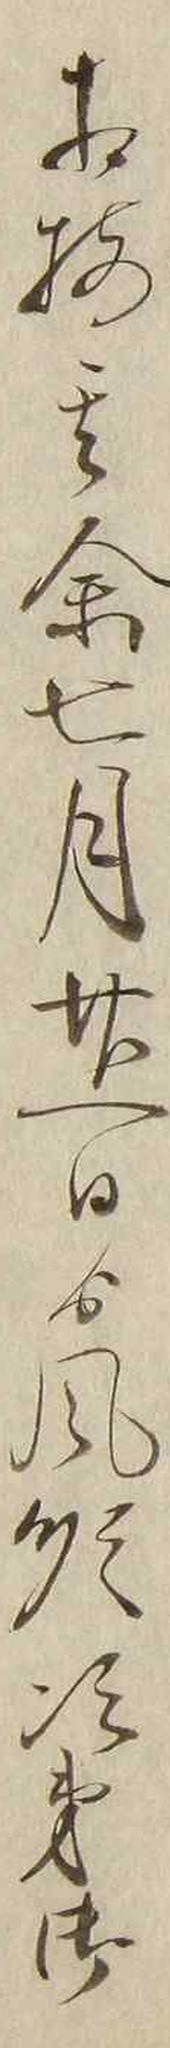相揃其余七月廿一日ゟ風順次第御
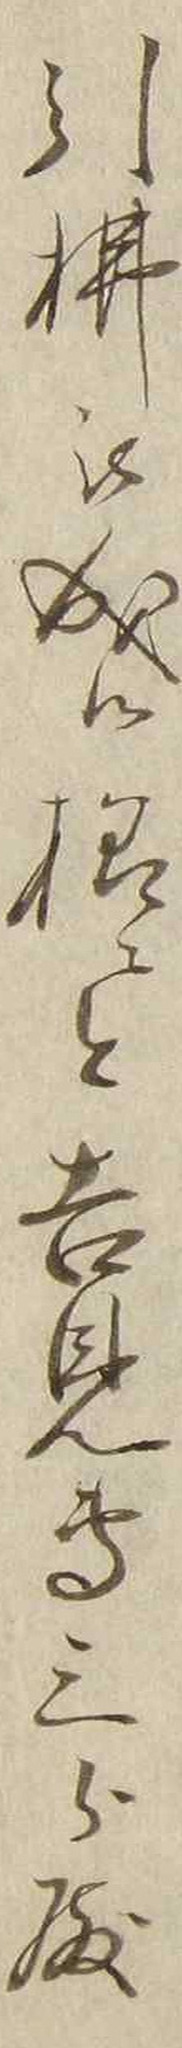引払被成候様にと吉見専三郎殿

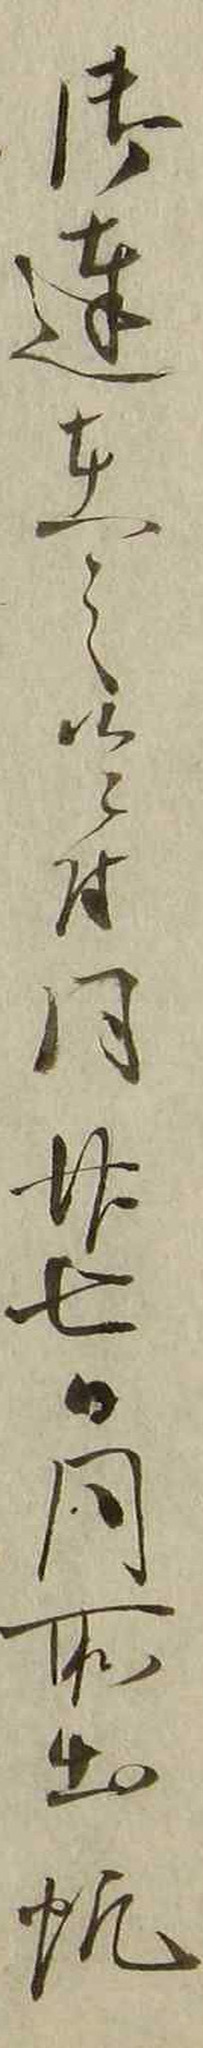御達在之候に付同廿七日同所出帆
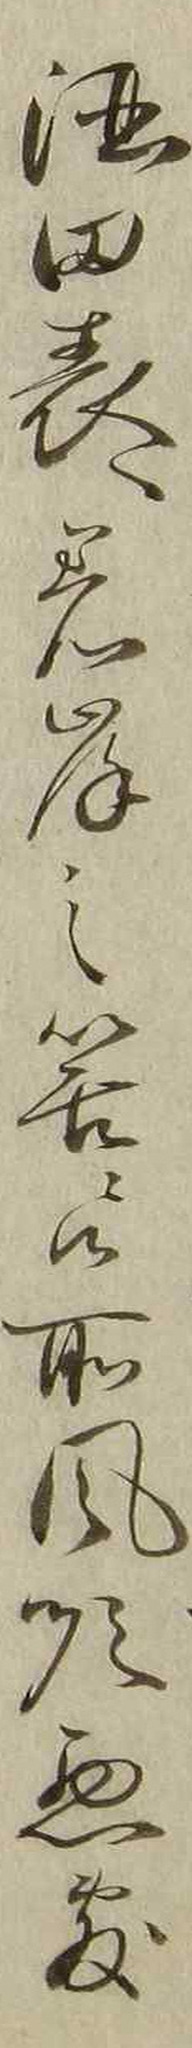酒田表へ着岸之筈に候所風順悪敷
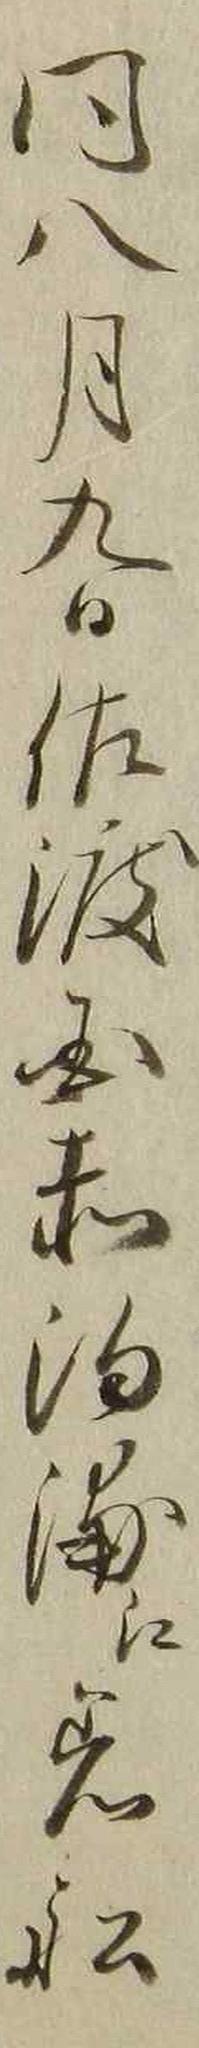同八月九日佐渡国赤泊浦へ着船
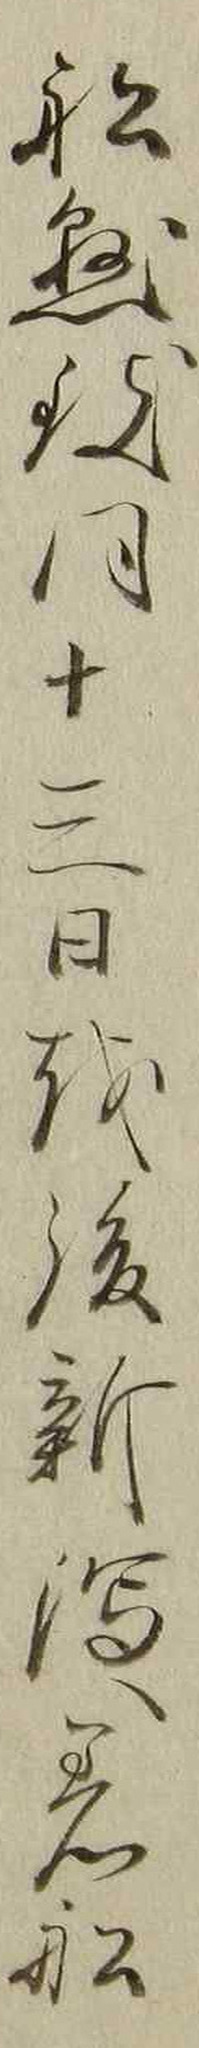船懸致同十三日越後新潟へ着船
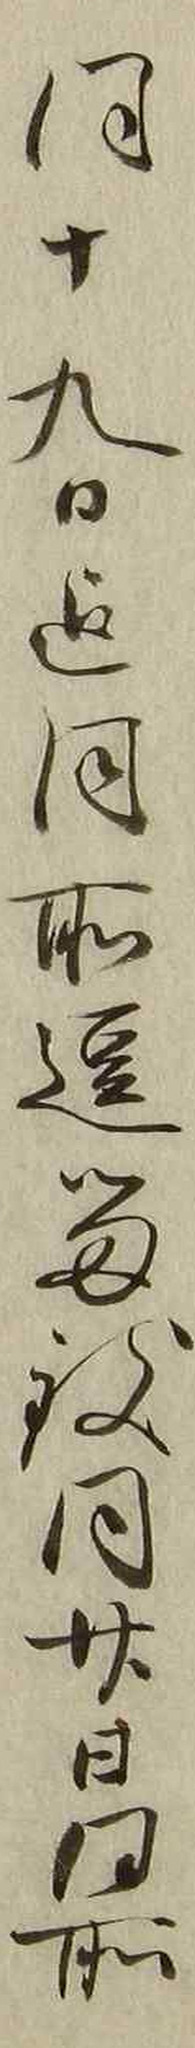同十九日迄同所逗留致同廿日同所
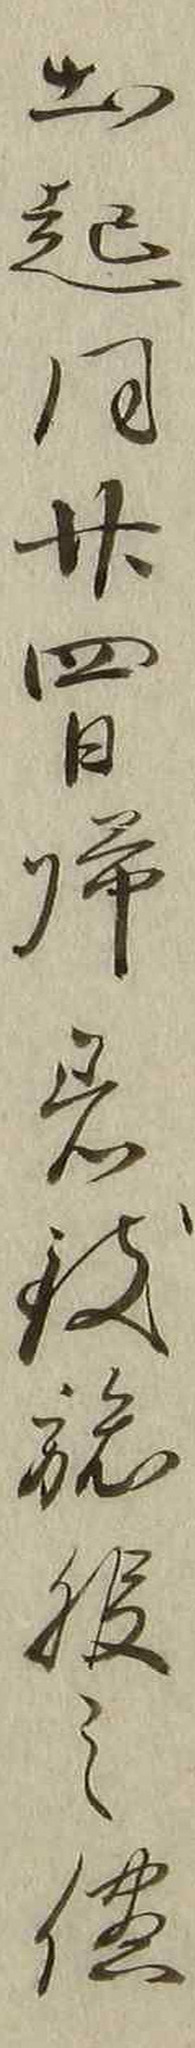出起同廿四日帰着致旅服之儘
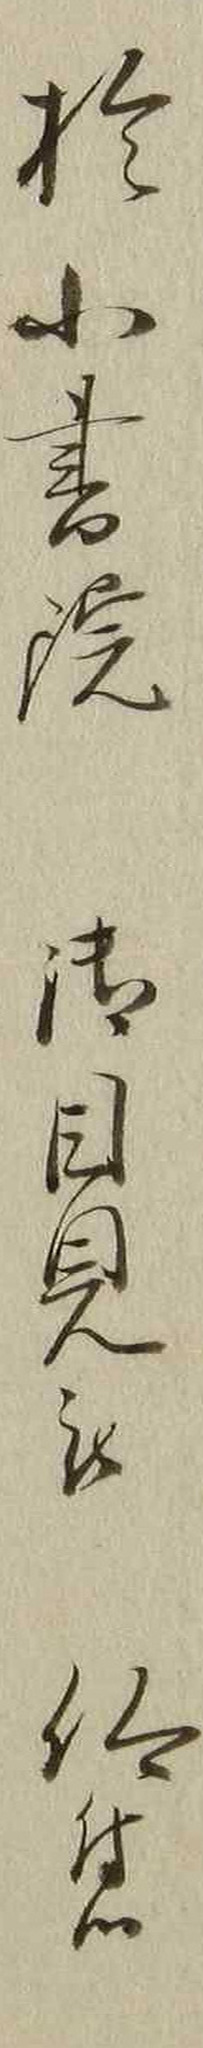於小書院御目見被仰付候
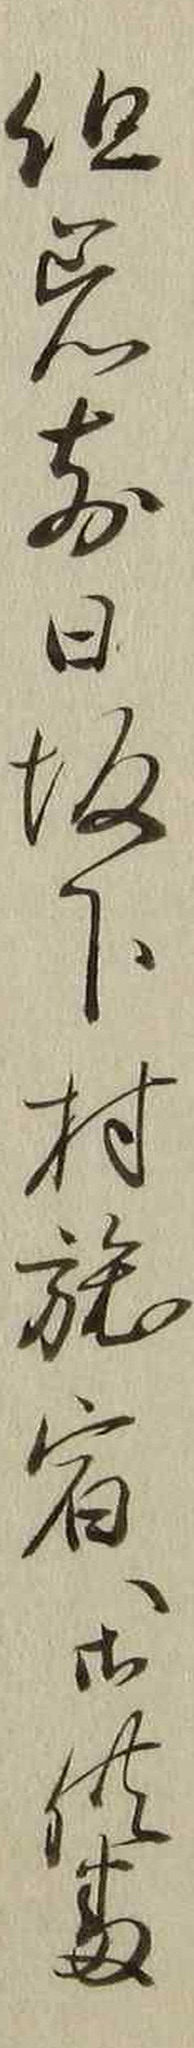但着前日坂下村旅宿へ御供番
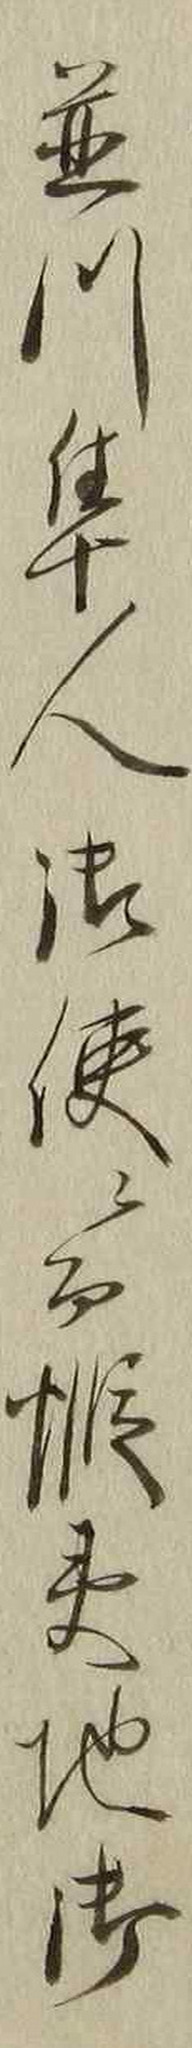並川集人御使に而蝦夷地御
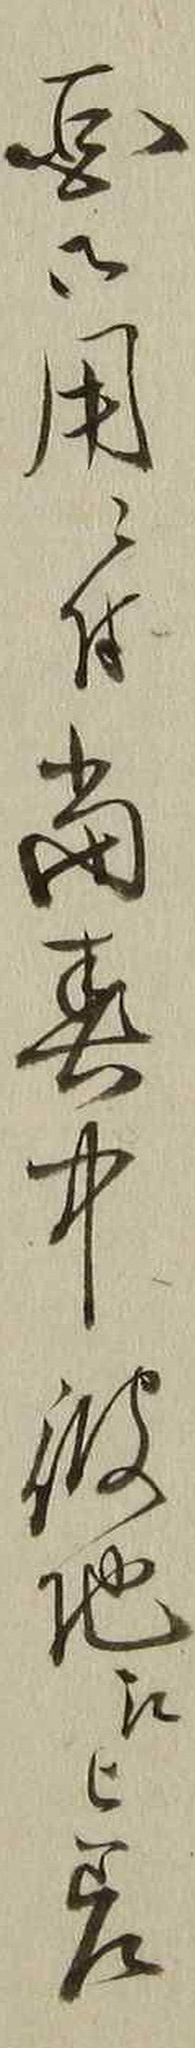固御用に付当春中彼地江被差
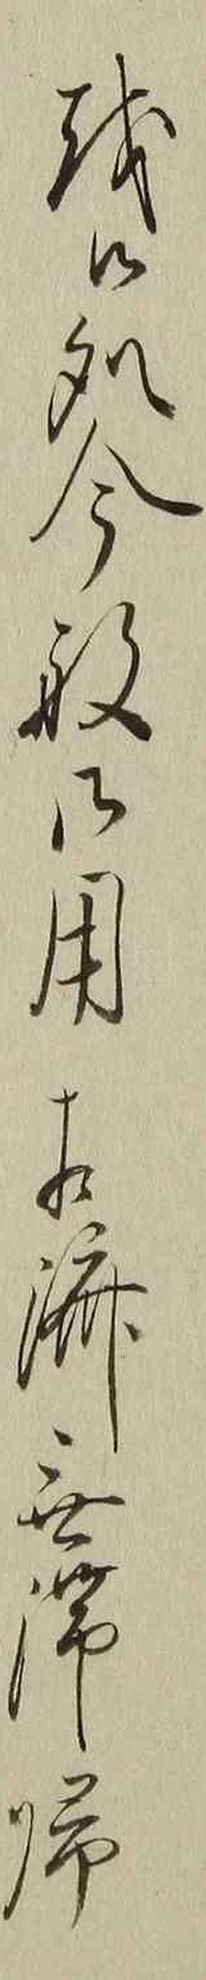越候処今般御用相済無滞帰
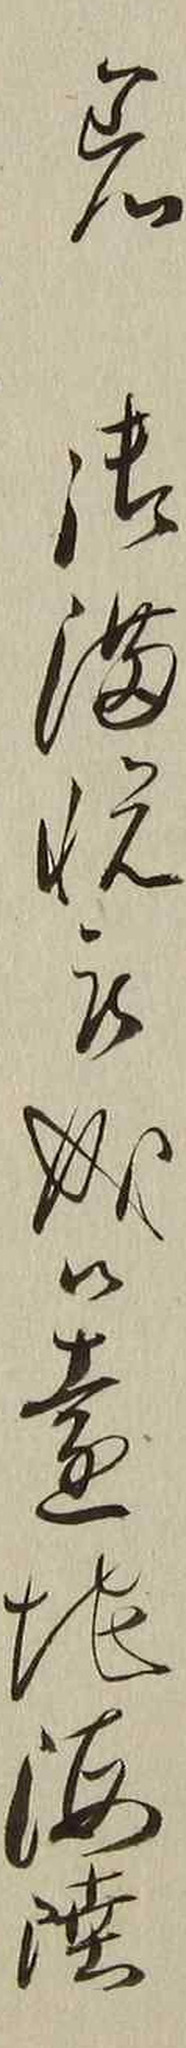着御満悦被成候遠地海陸
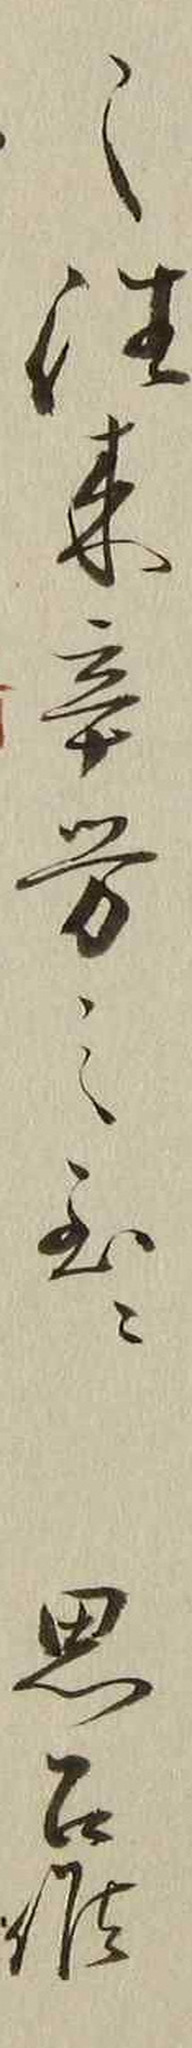之往来辛労之至に思召候
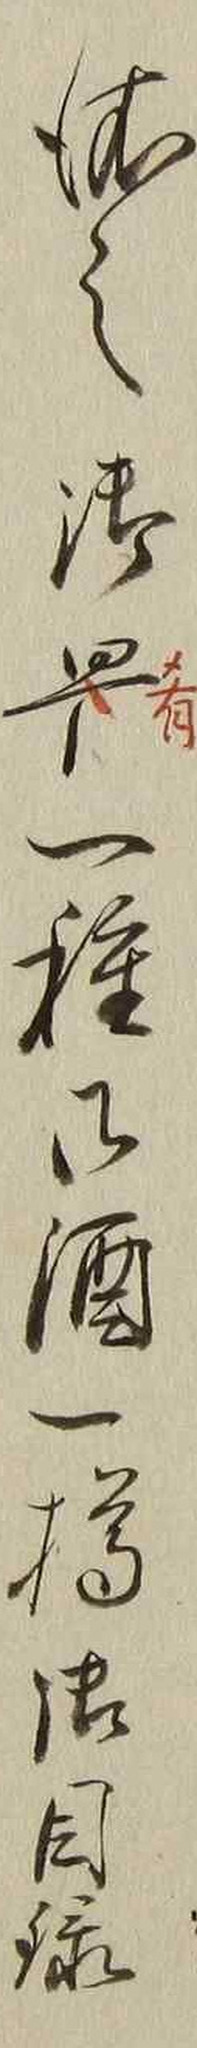依之御骨一種御酒一樽御目録
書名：諸士系譜　巻之103　か之部11
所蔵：会津若松市立会津図書館
